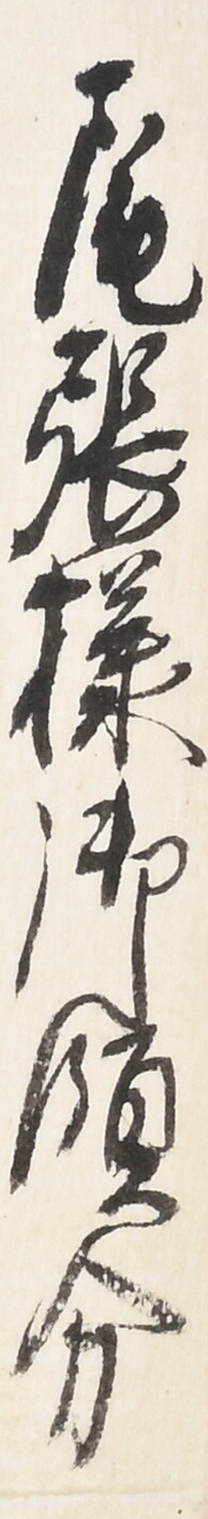尾張様御領分
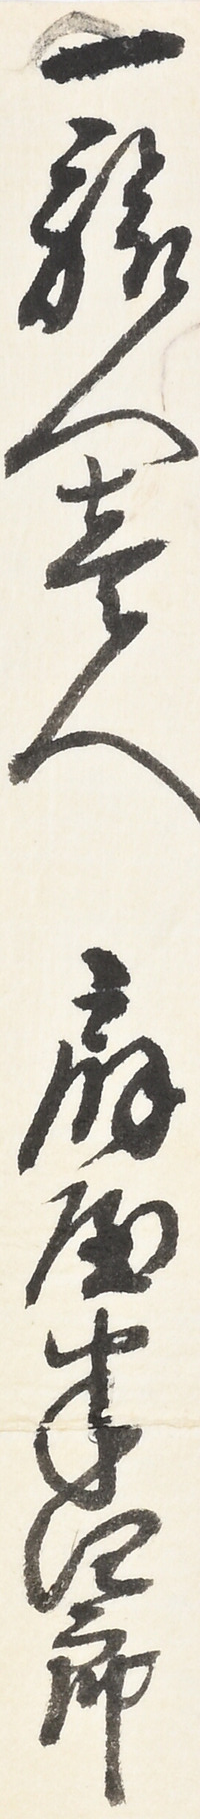一旅人壱人扇屋半四郎
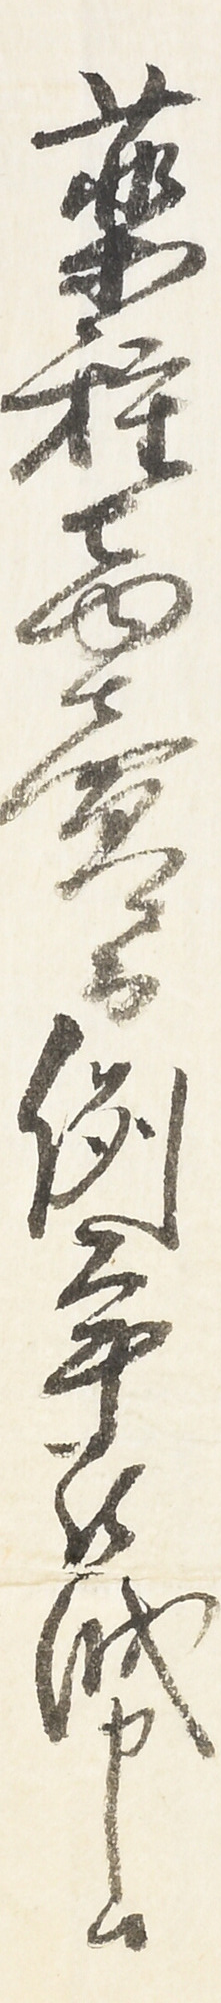薬種商売ニ而例年罷越申候
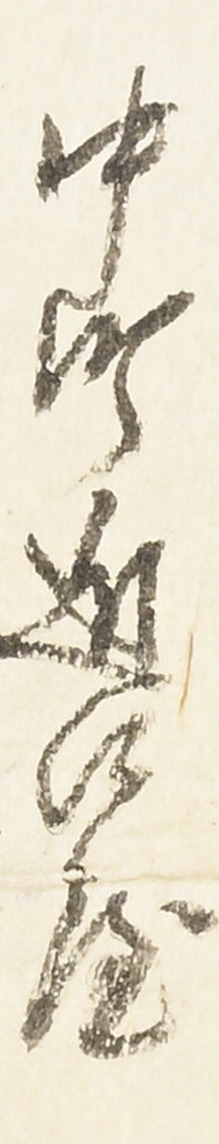中町近江屋
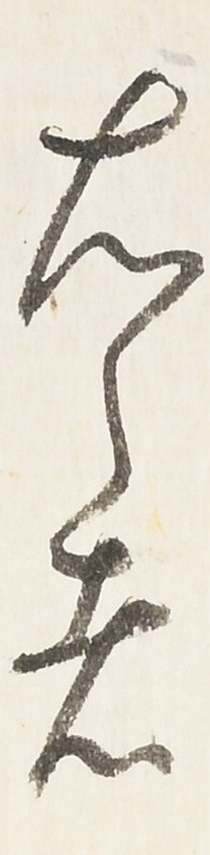右之者
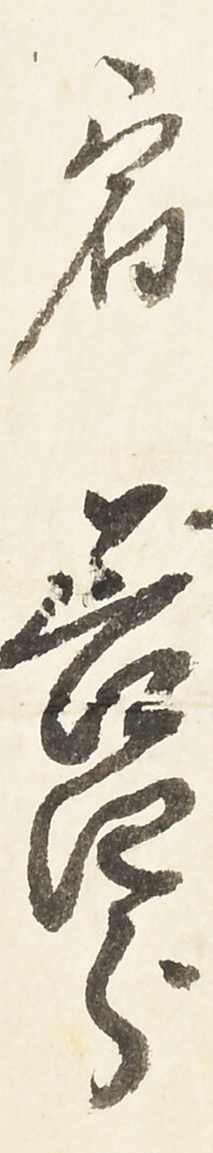宿善四郎
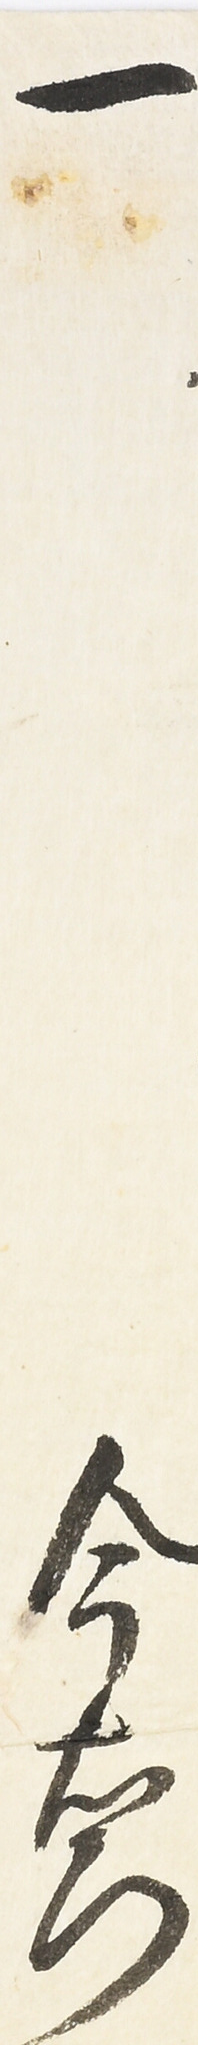一今右衛門
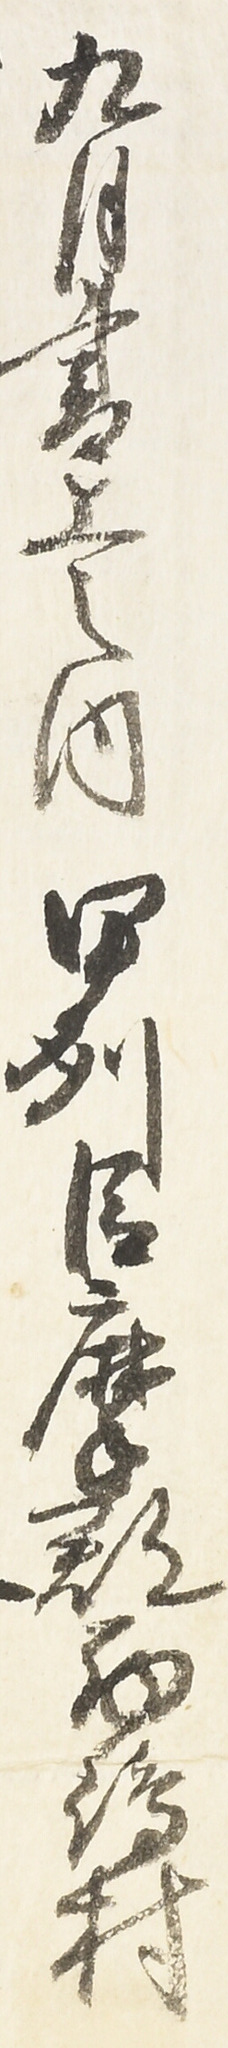九月書上之内甲州巨摩郡西嶋村
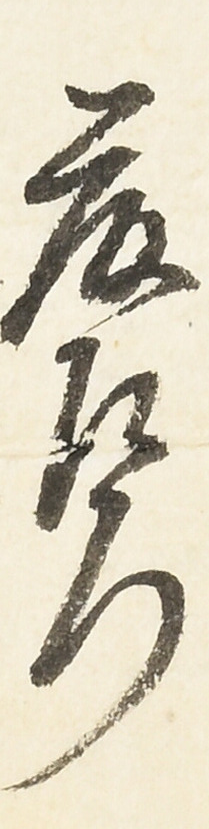藤左衛門
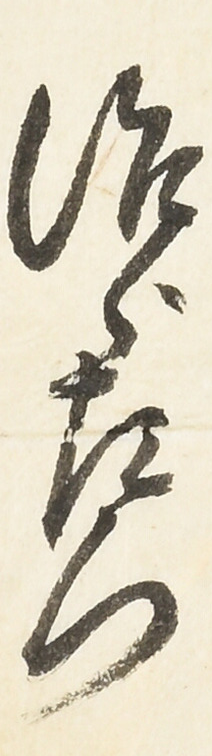治郎左衛門
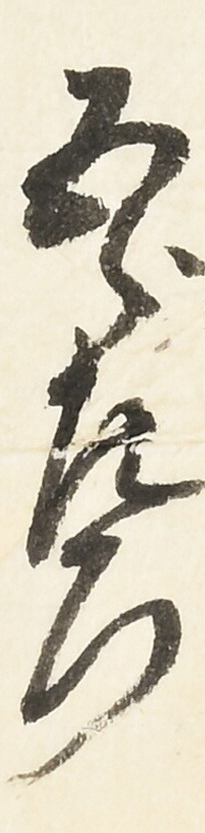五郎左衛門
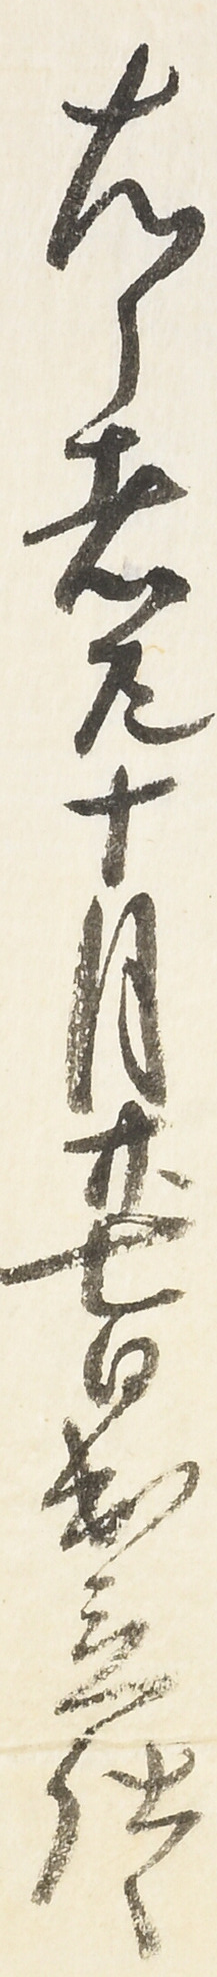右之者共十月廿七日出立仕候
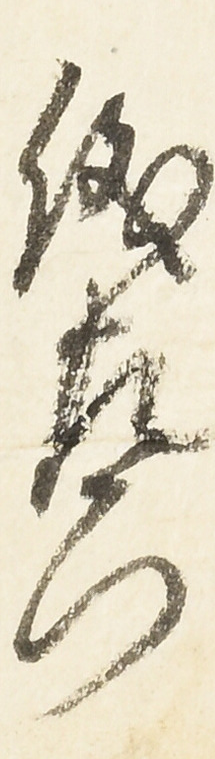儀左衛門
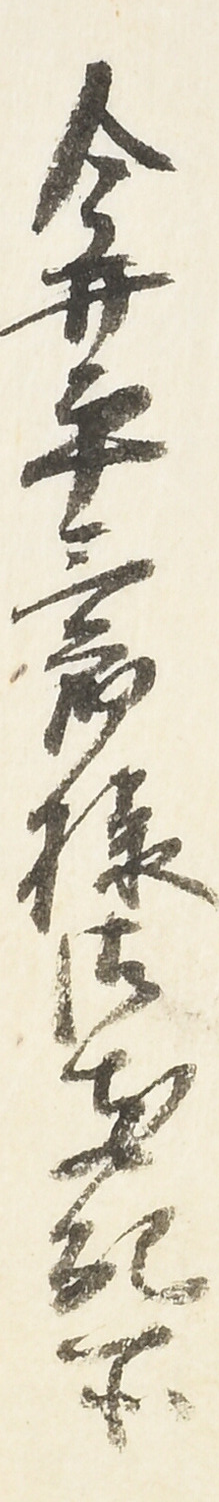今井平三郎様御支配所
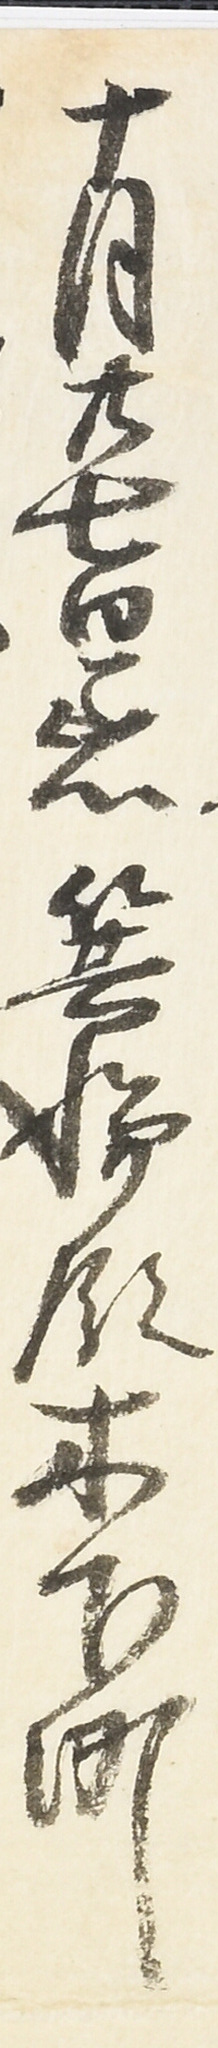十月廿七日着箕輪領木下町
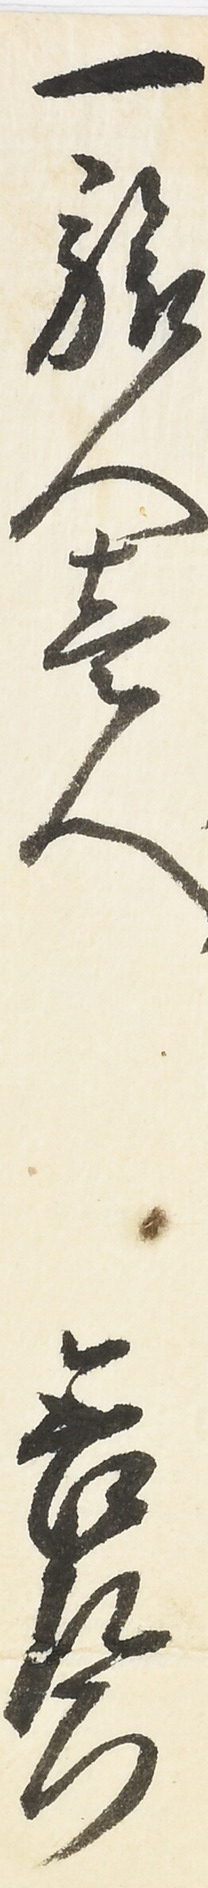一旅人壱人善左衛門
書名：町中旅人泊控帳
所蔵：伊那市立高遠町図書館・合同会社AMANE
